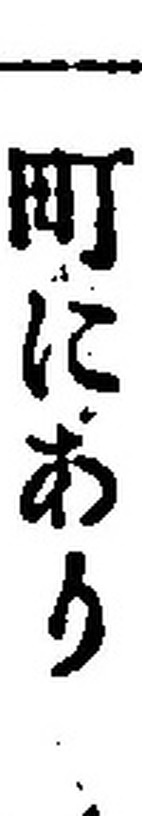町にあり
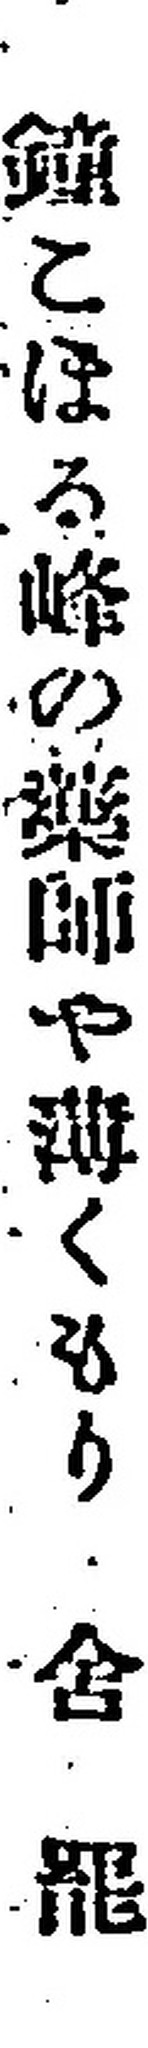鐘こほる峰の薬師や薄くもり舎罷
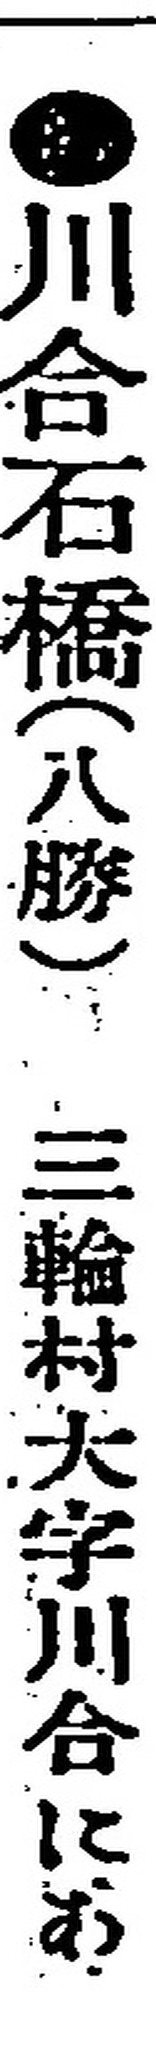●川合石橋(八勝)三輪村大字川合にあ
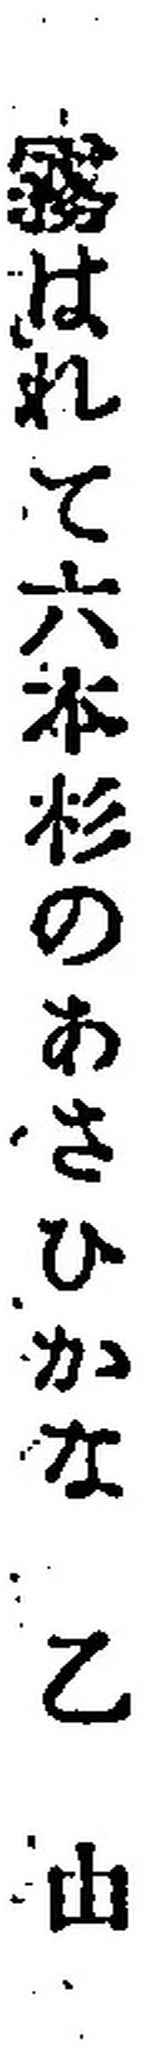霧はれて六本杉のあさひかな乙由
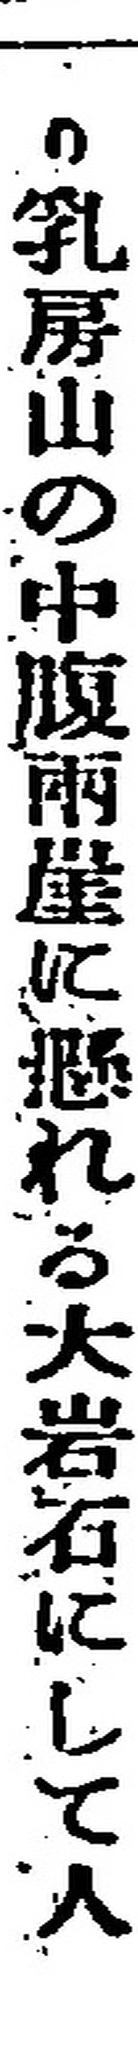り乳房山の中腹両崖に懸れる大岩石にして人
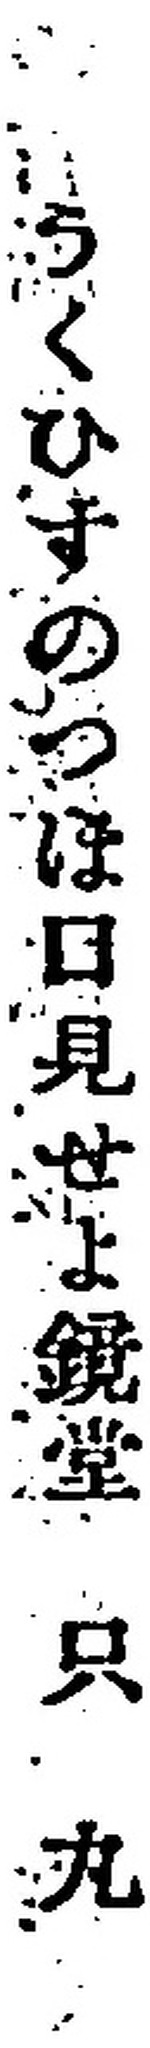うくひすのつほ口見せよ鏡堂只丸
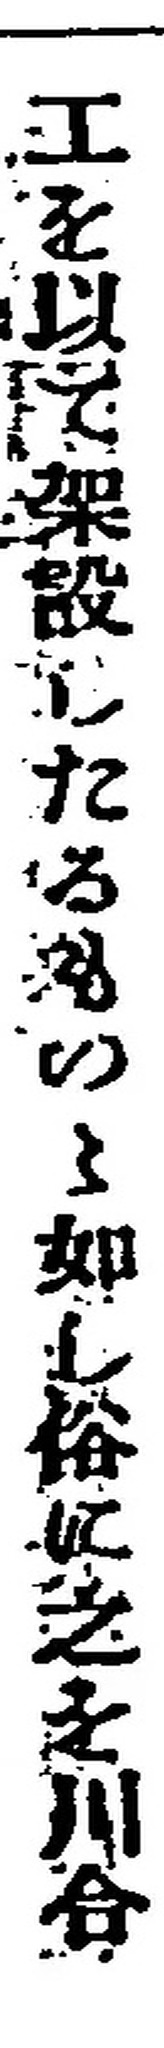工を以て架設したるものゝ如し俗に之を川合
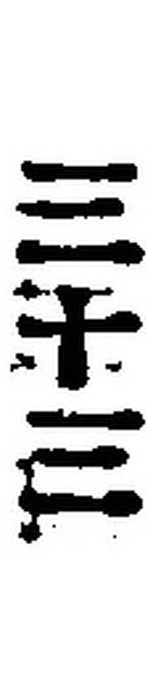三十三

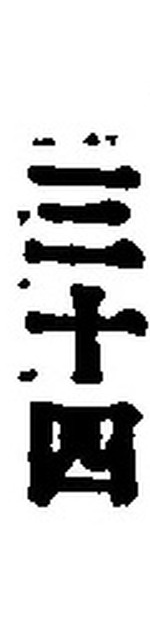三十四
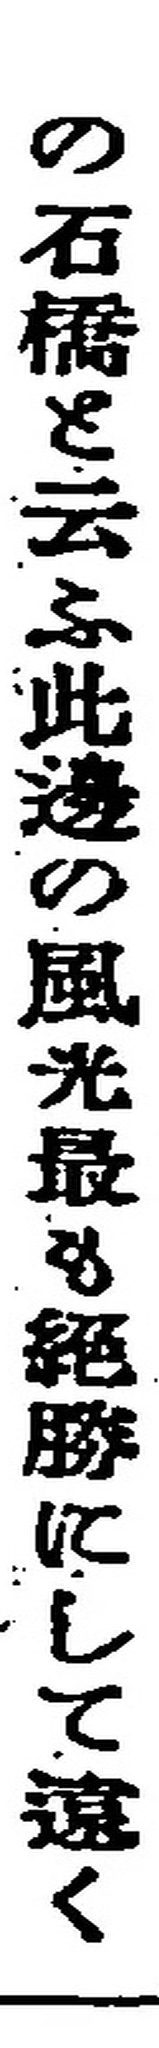の石橋と云ふ此辺の風光最も絶勝にして遠く
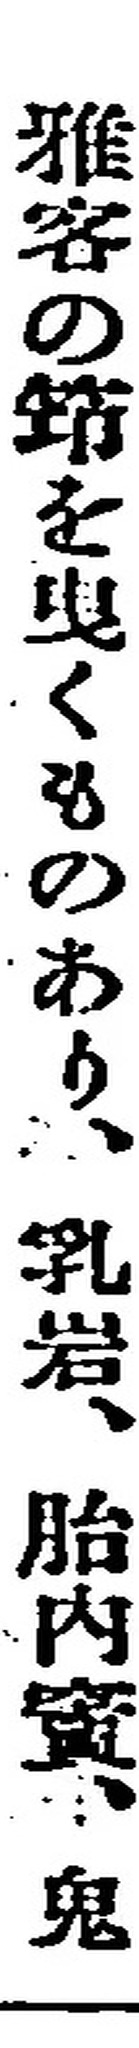雅客の笻を曳くものあり、乳岩、胎内竇、鬼
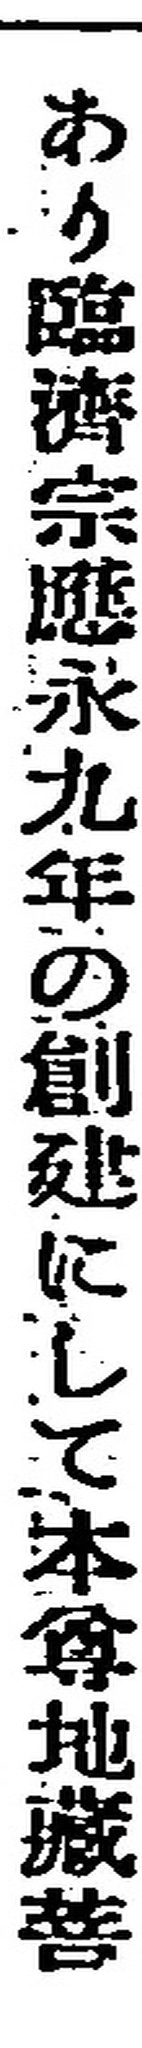あり臨済宗応永九年の創建にして本尊地蔵菩
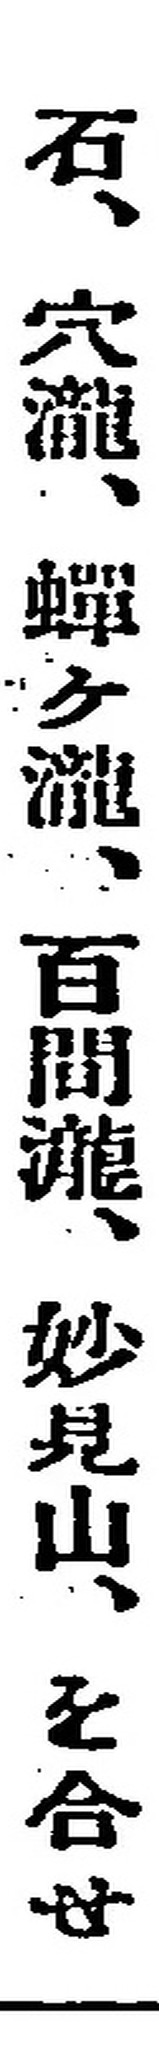石、穴瀧、蝉ヶ瀧、百間瀧、妙見山、を合せ
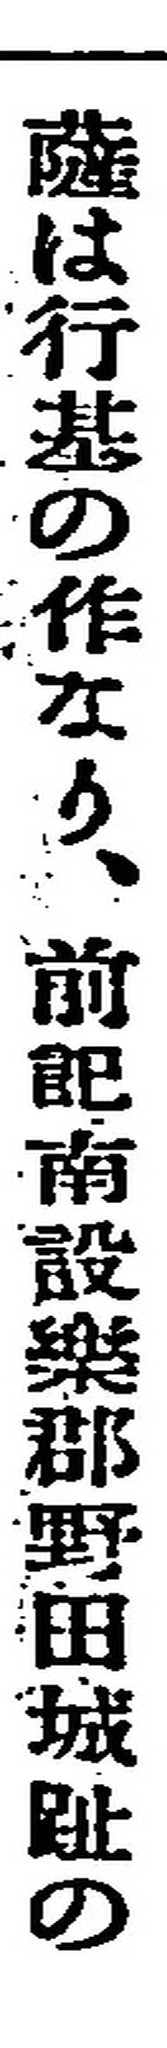薩は行基の作なり、前記南設楽郡野田城趾の
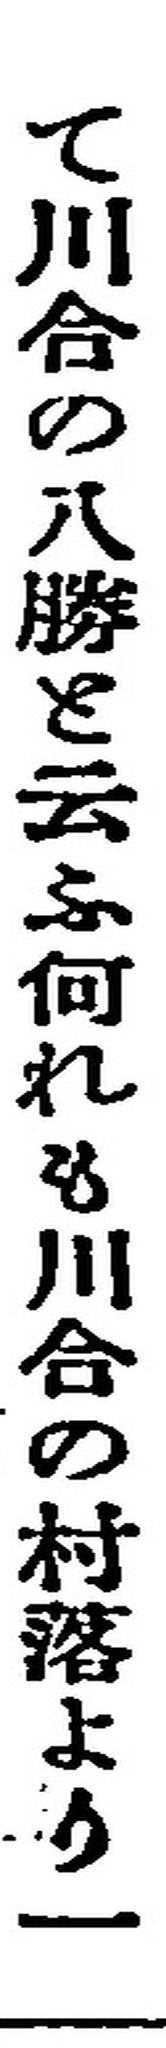て川合の八勝と云ふ何れも川合の村落より一
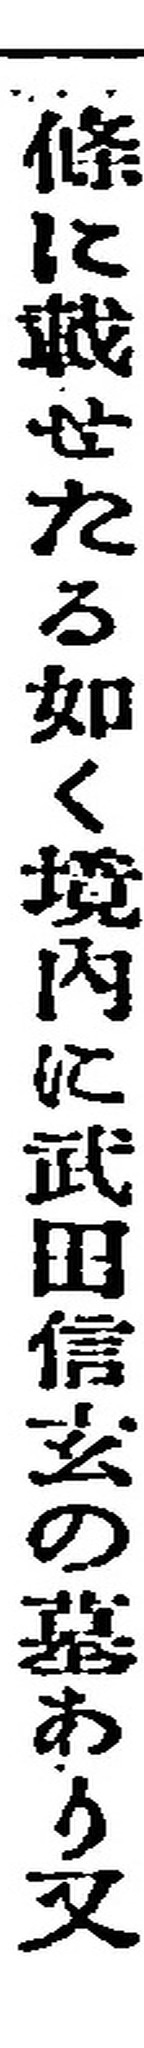条に載せたる如く境内に武田信玄の墓あり又
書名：東参名勝案内
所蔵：国立国会図書館 National Diet Library, JAPAN
